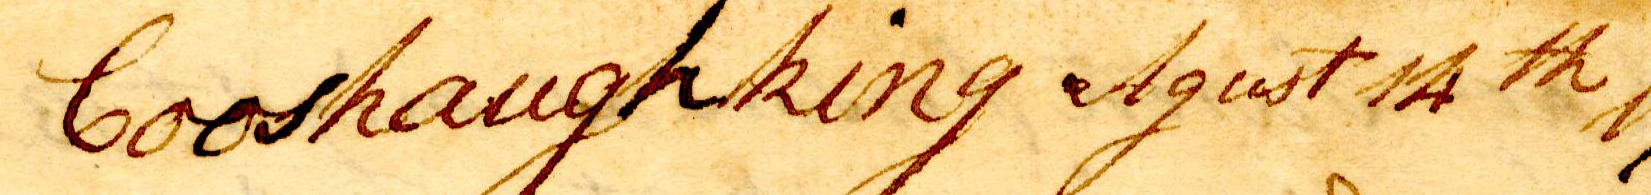Cooshaughking Agust 14^th
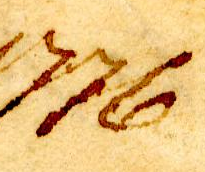1776
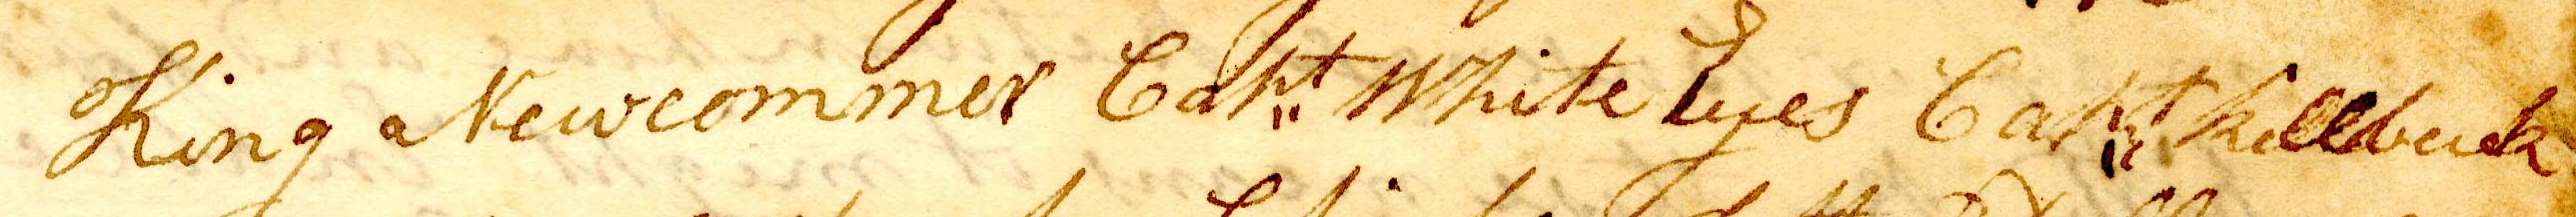King Newcommer Cap^t. White Eyes Cap^t Killbuck
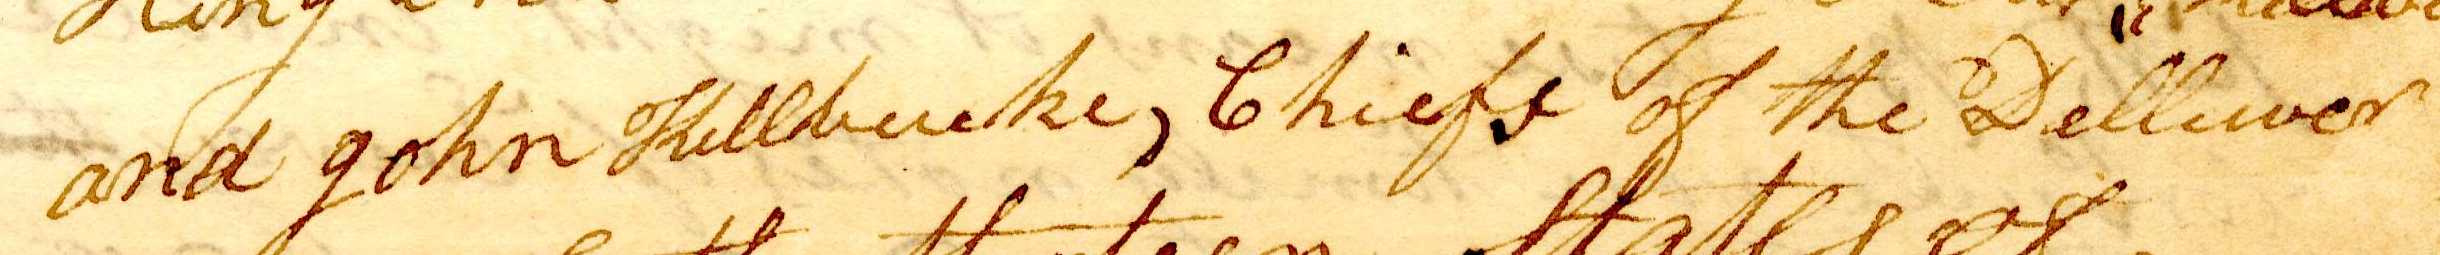and John Killbucke, Chiefs of the Dellewer
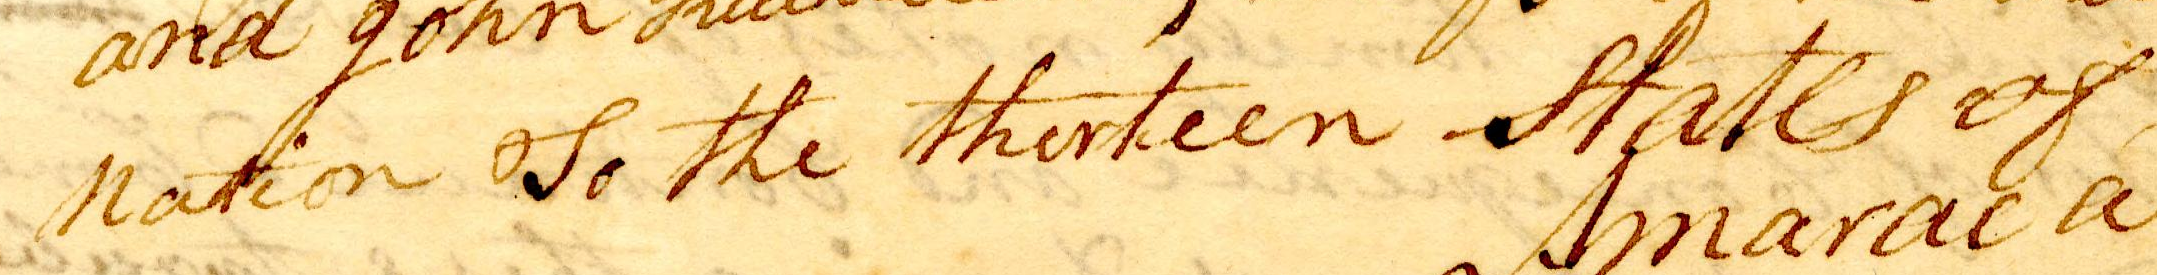Nation To the therteen States of
